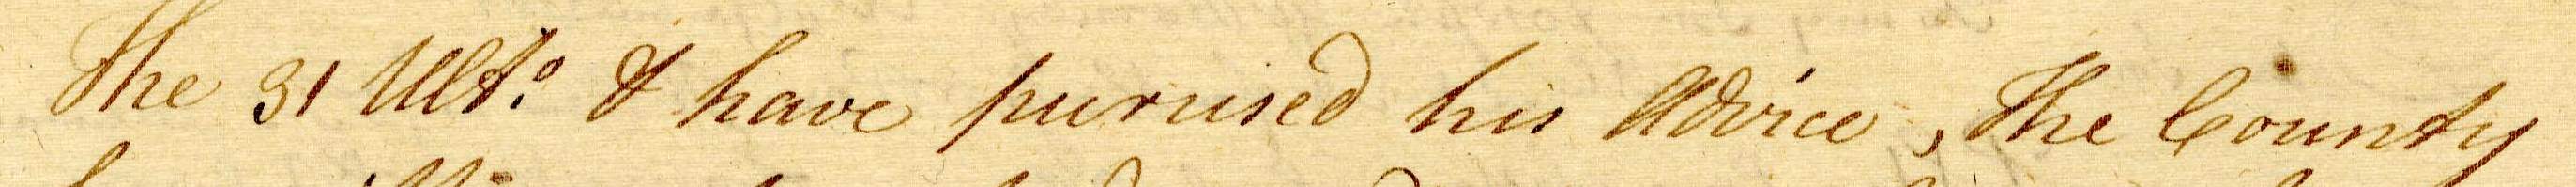The 31 Ult^o. & have purused his Advice, The County
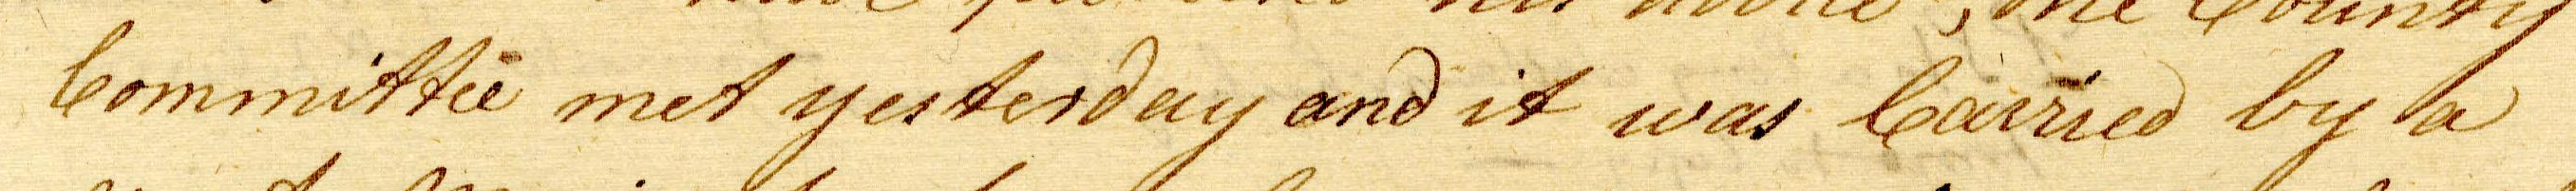Committee met yesterday and it was Carried by a
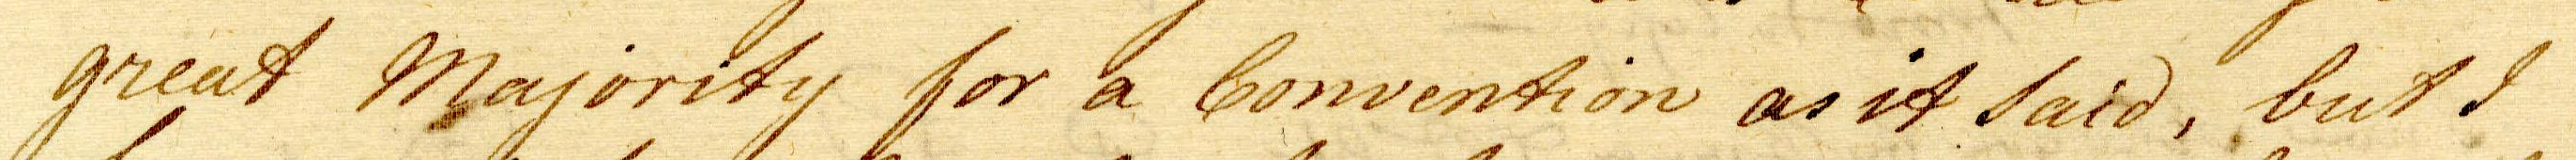great Majority for a Convention as it said, but I
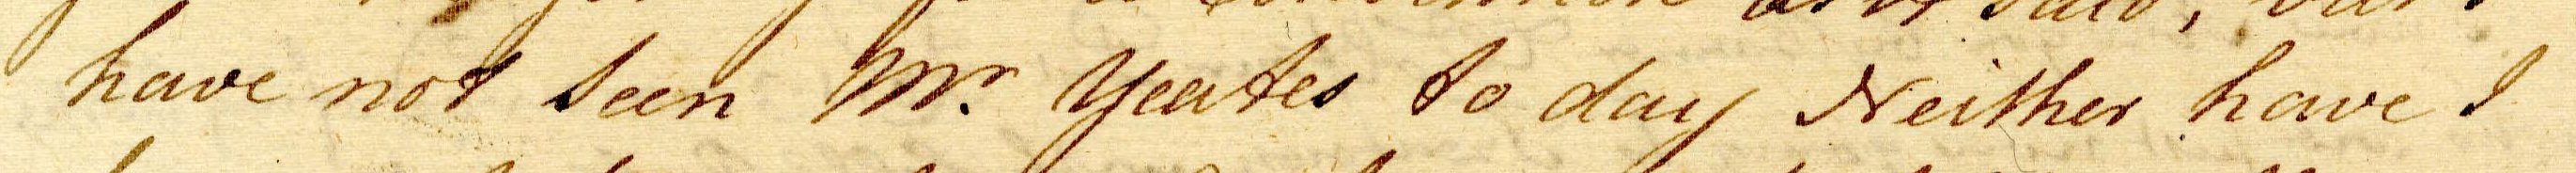have not seen M^r. Yeates to day Neither have I
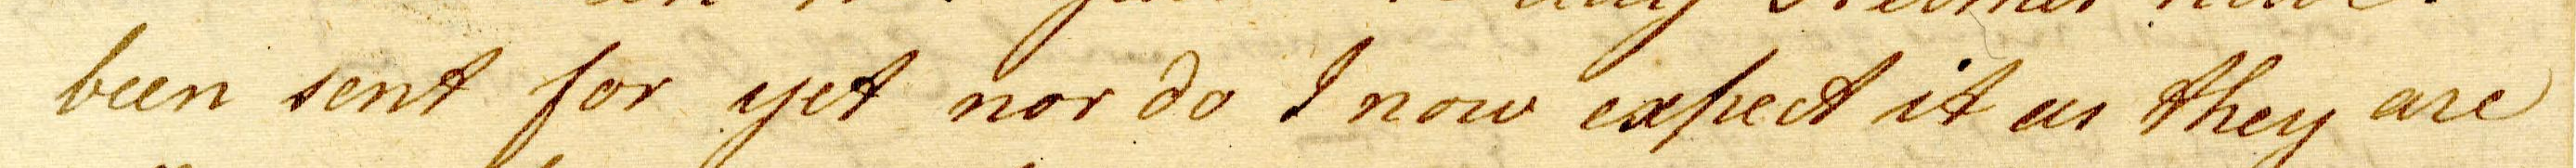been sent for yet nor do I now expect it us they are
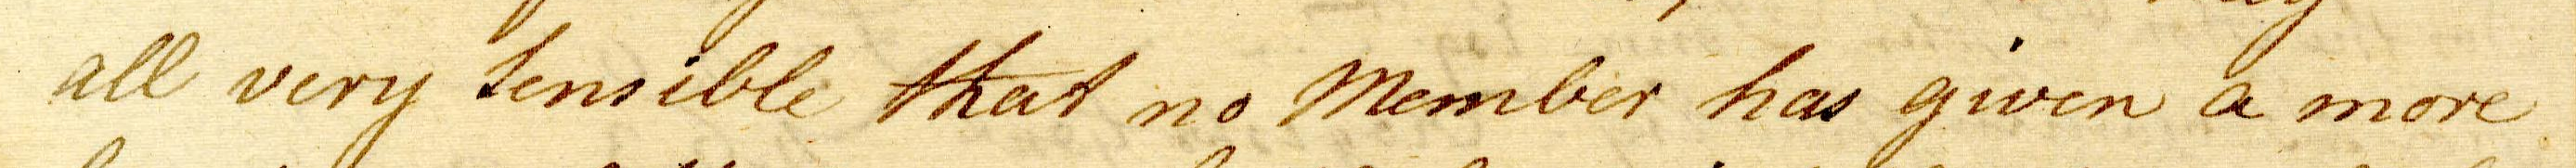all very Sensible that no Member has given a more
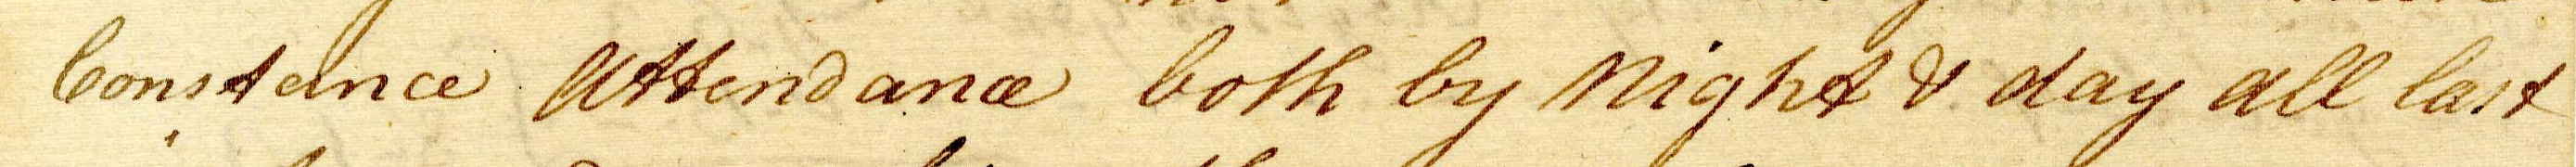Constance Attendance both by night & day all last
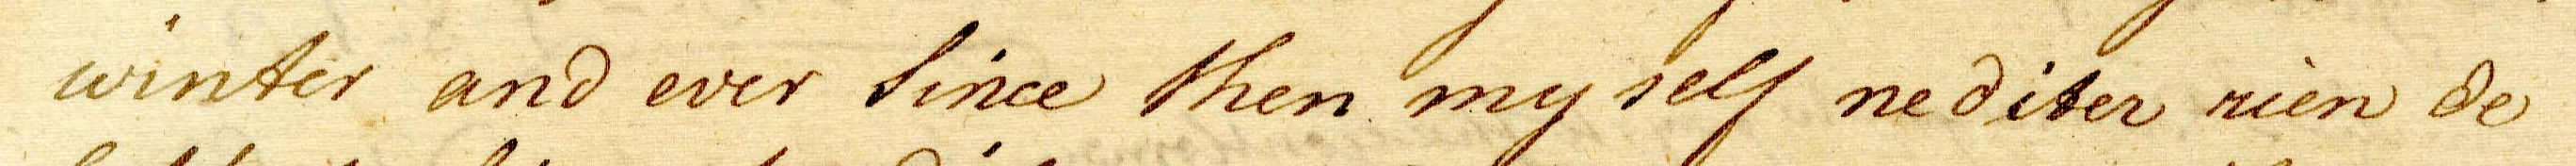winter and ever Since then my self nediter rien de
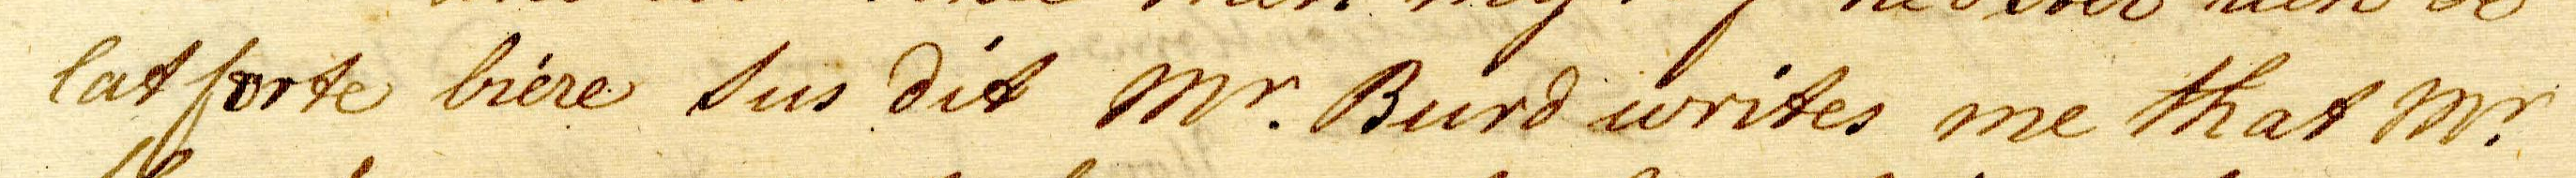lat forte brére sus dit M^r. Burd writes me that M^r.
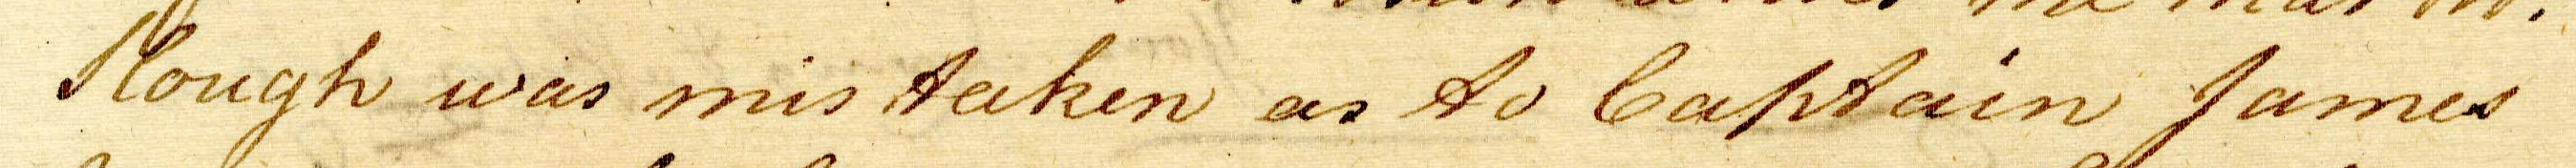Slough was mistaken as to Captain James
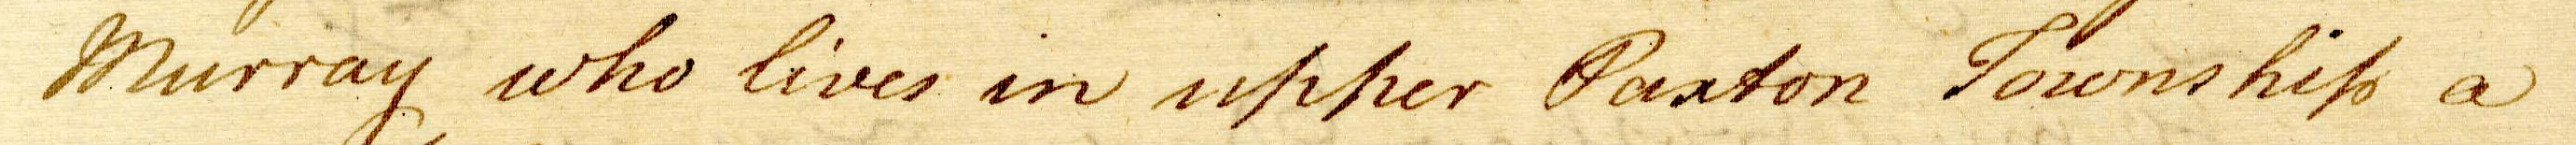Murray who lives in upper Paxton Township a
